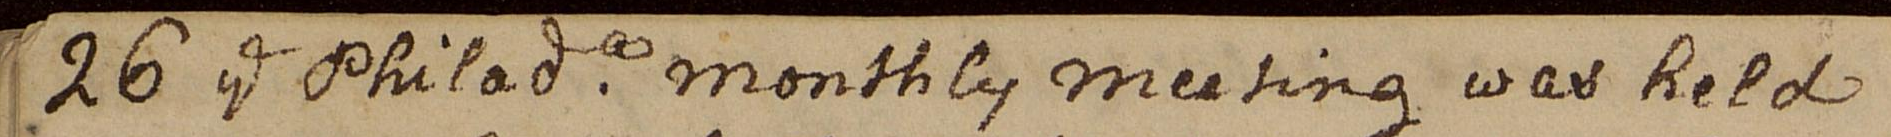26 y^e Philad^a. Monthly Meeting was held
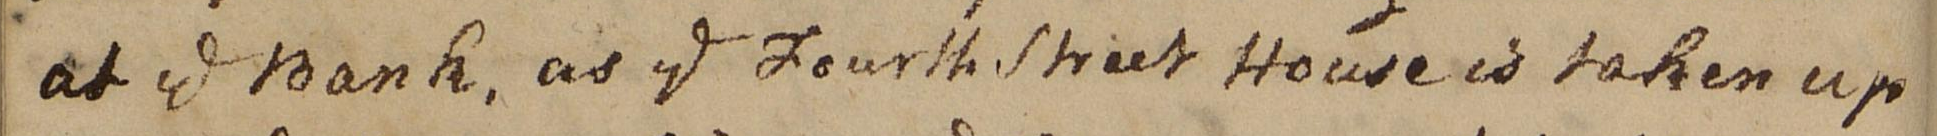at y^e Bank, as y^e Fourth Street House is taken up
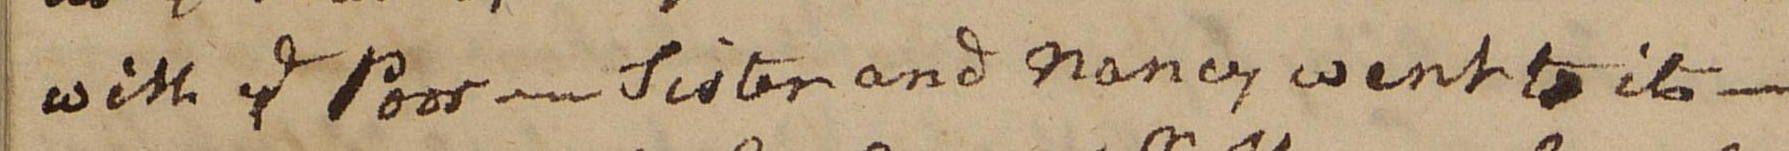with y^e Poor- Sister and Nancy went to it-
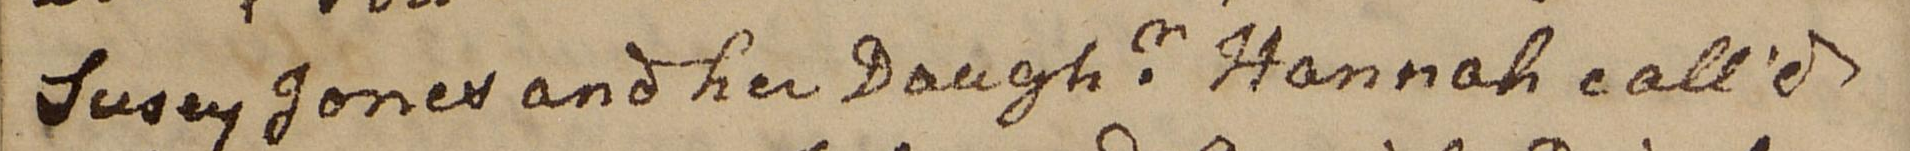Susey Jones and her Daugh^r. Hannah call'd
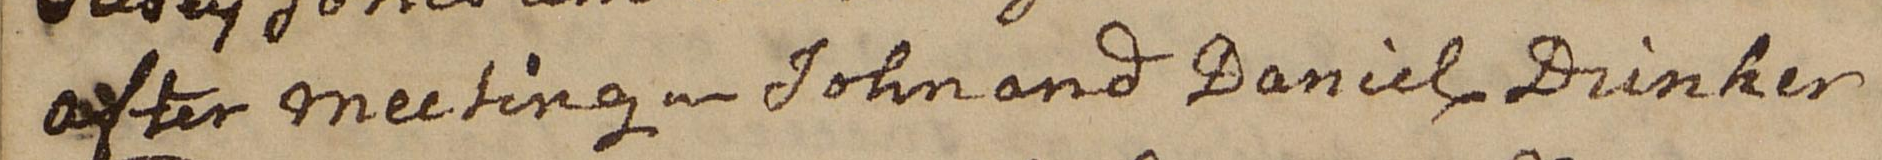after meeting- John and Daniel Drinker
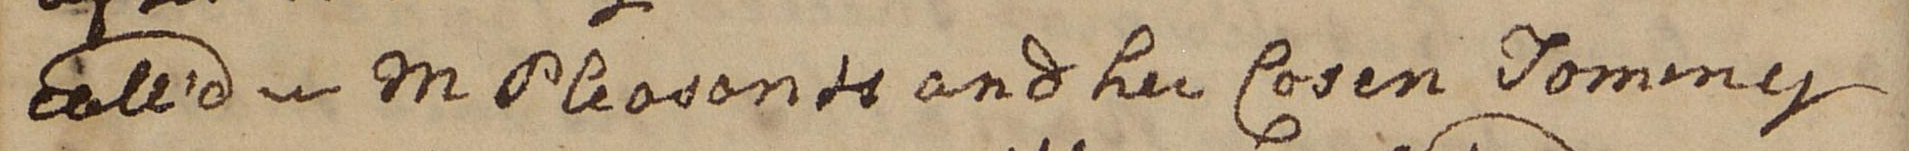call'd - M Pleasants and her Cosen Tommy
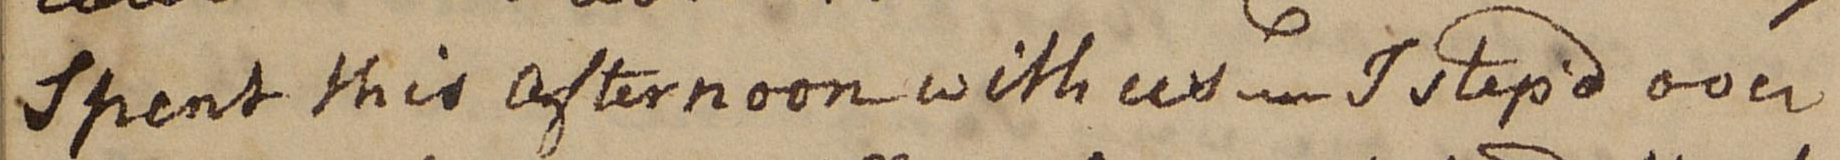Spent this Afternoon with us- I step'd over
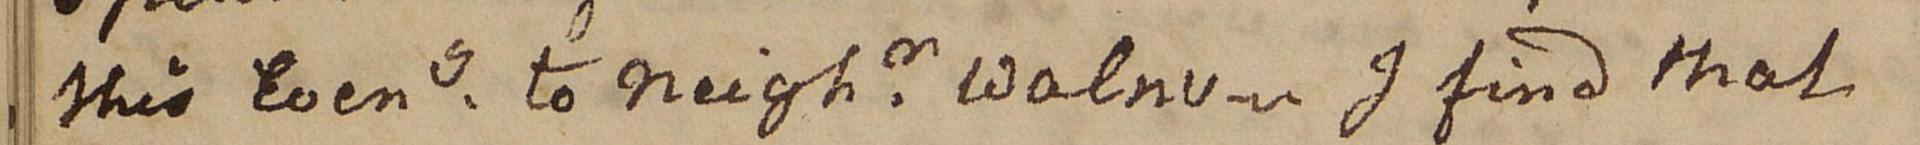this Even^g. to Neigh^r. Walns- I find that
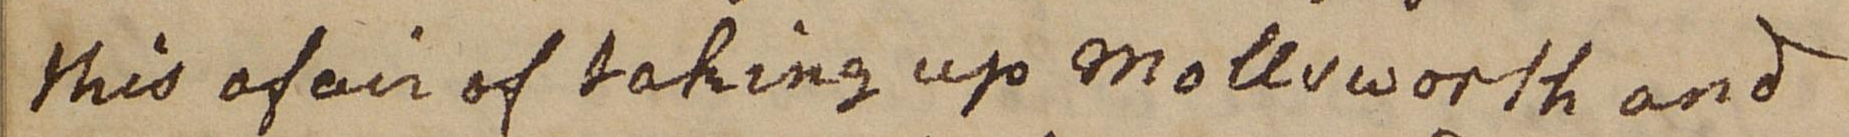this a fair of taking up Mollsworth and,
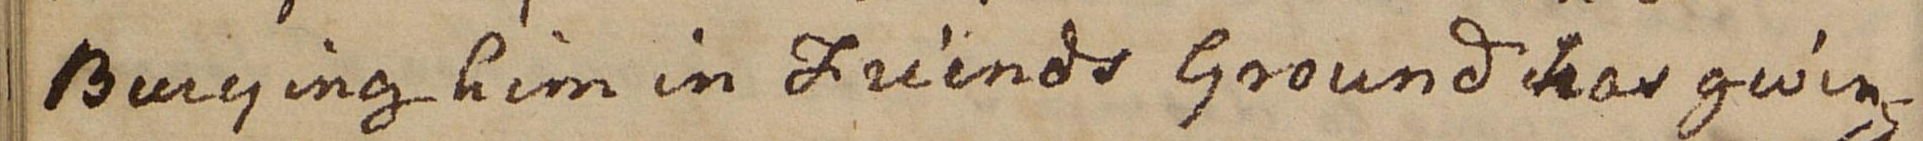Burying him in Friends Ground has giving
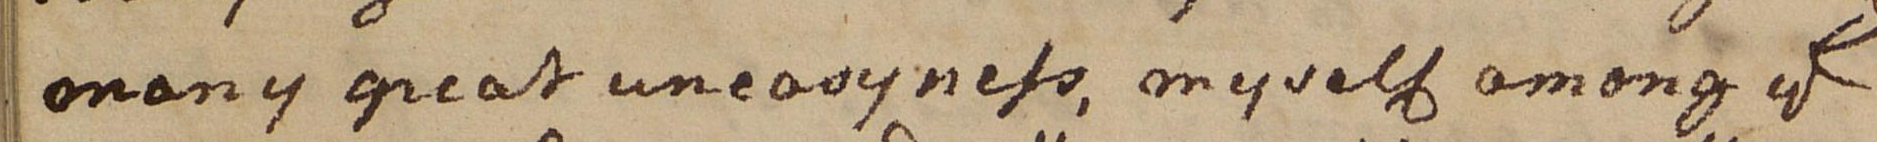many great uneasyness, myself among y^e
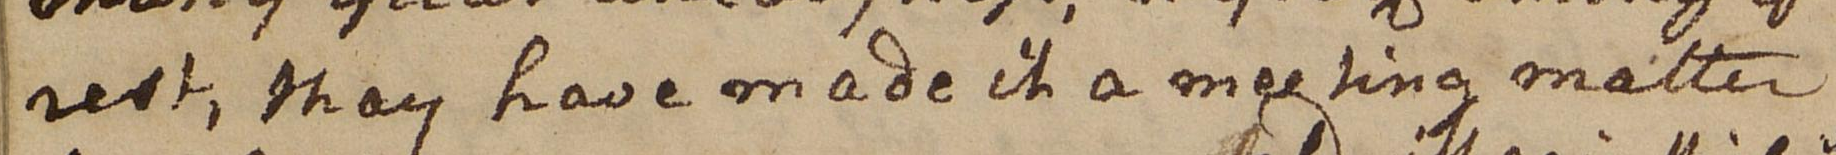rest, thay have made it a meeting matter
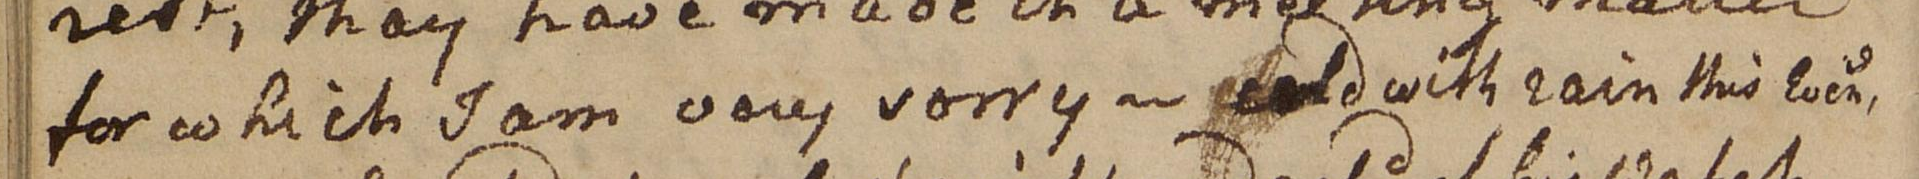for which I am very sorry - cold with rain this Even^g,
